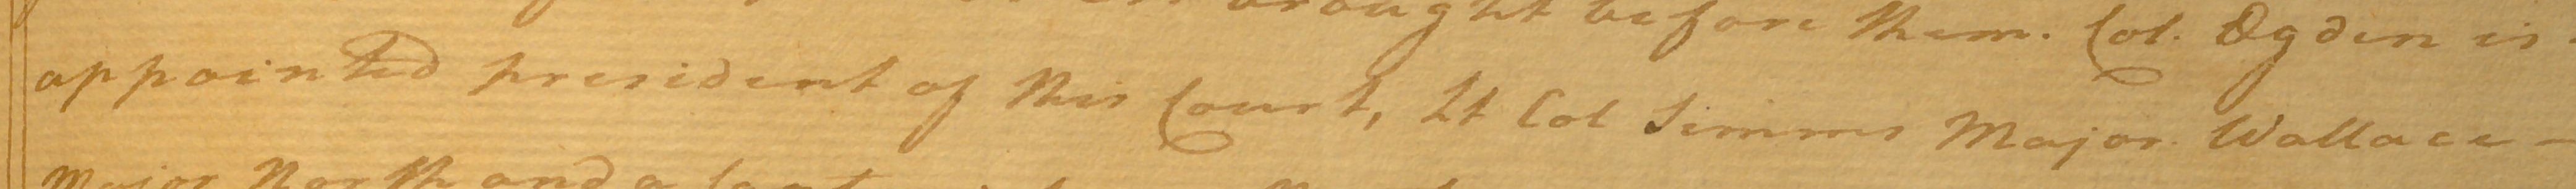appointed president of this Court, Lt Col Simms Major Wallace-
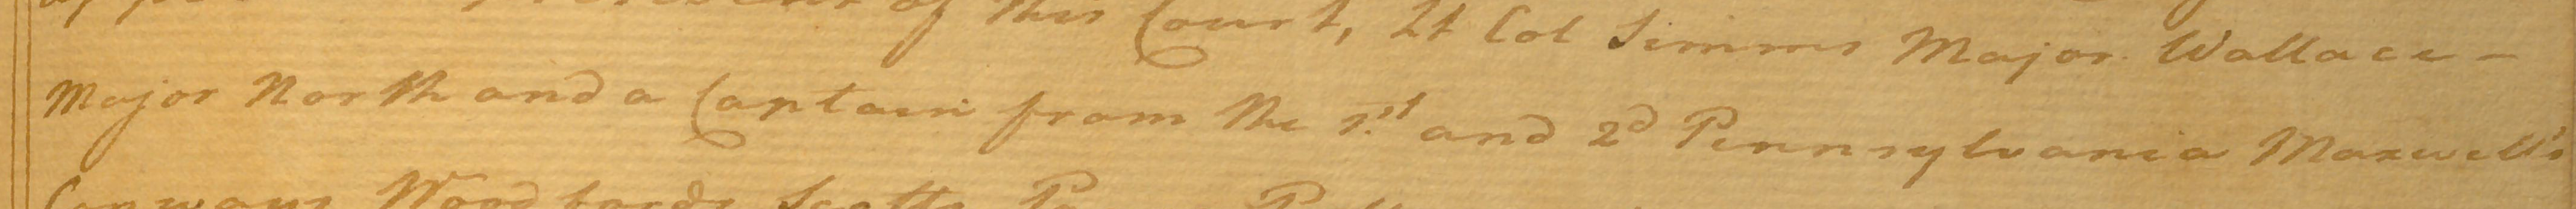Major North and a Captain from the 1^st. and 2^d Pennsylvania Maxwells
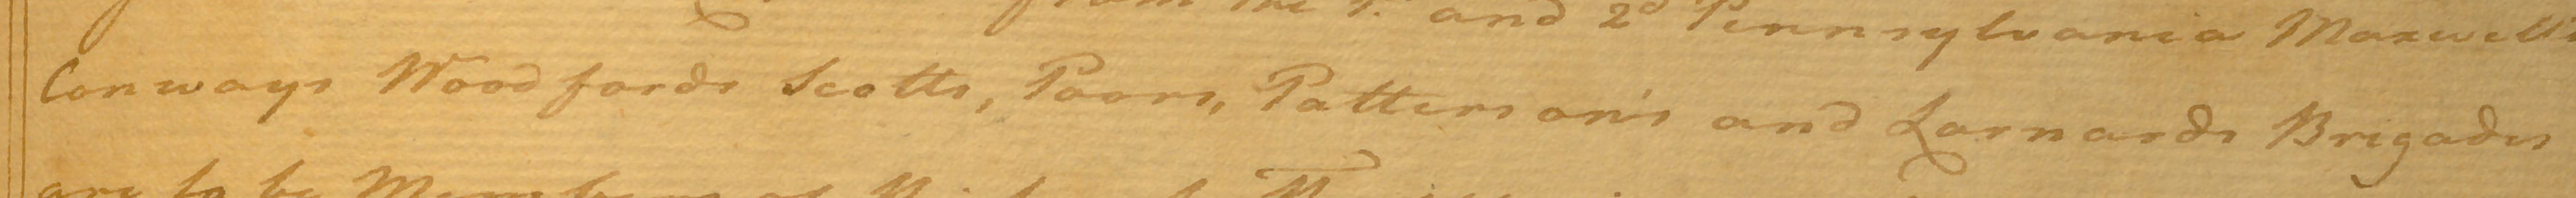Conways Woodfords Scotts, Poors, Patterson's and Leonards Brigades
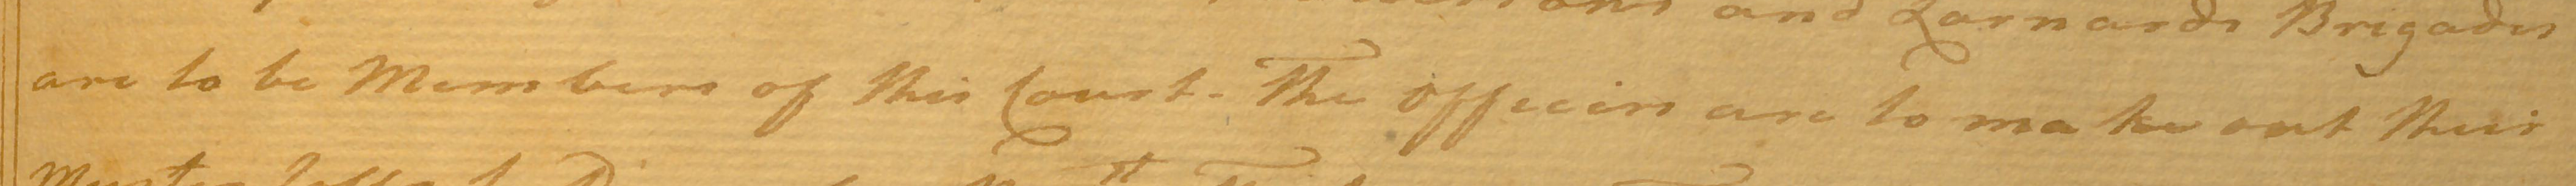are to be Members of this Court. The Officers are to make out their
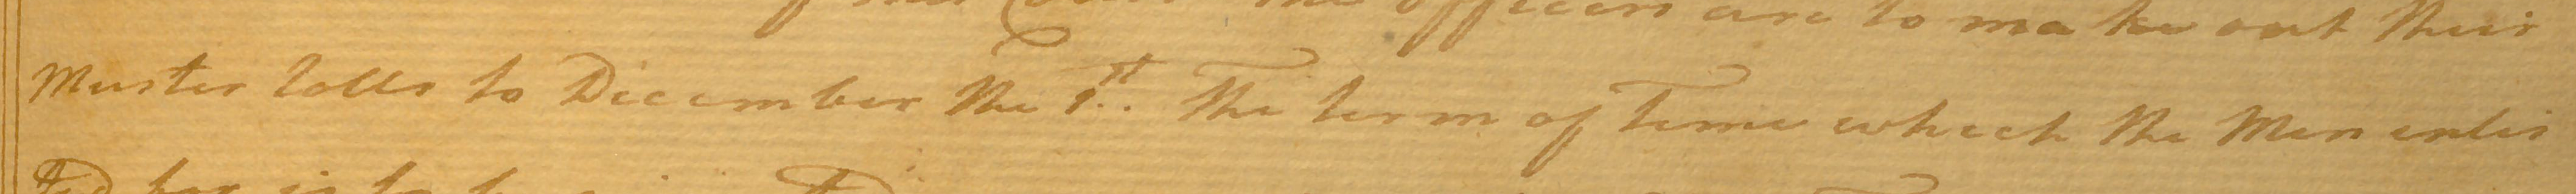Muster rolls to December the 1^st. The term of Time which the men enlis
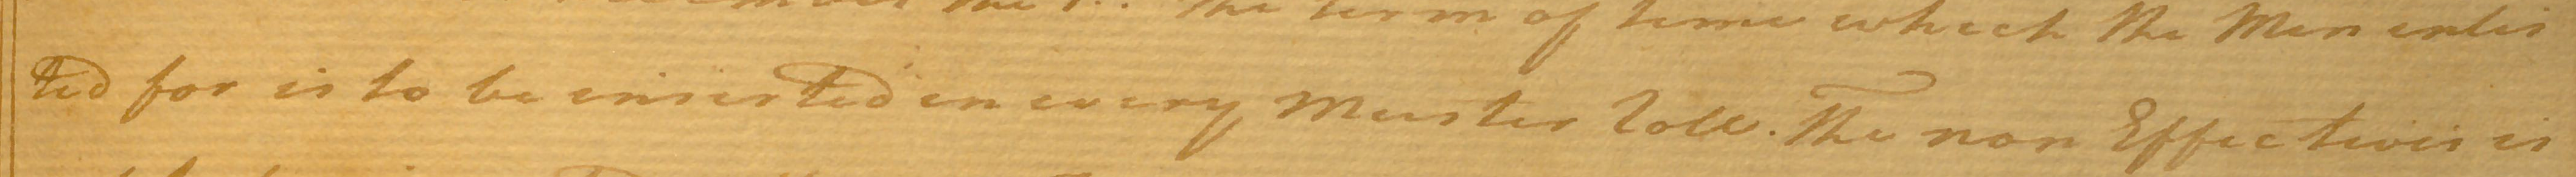ted for is to be inserted in every Muster roll. The non Effectives is
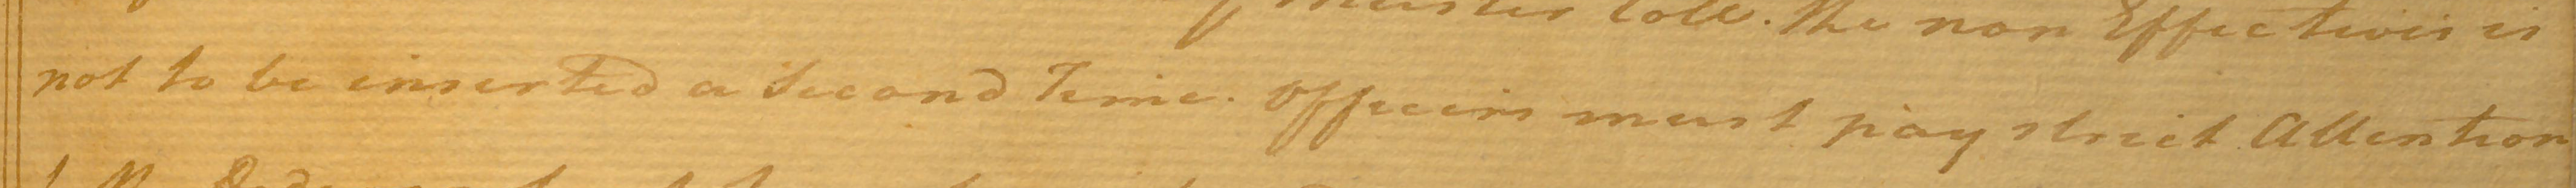not to be inserted a Second Time. Officers must pay strict Attention
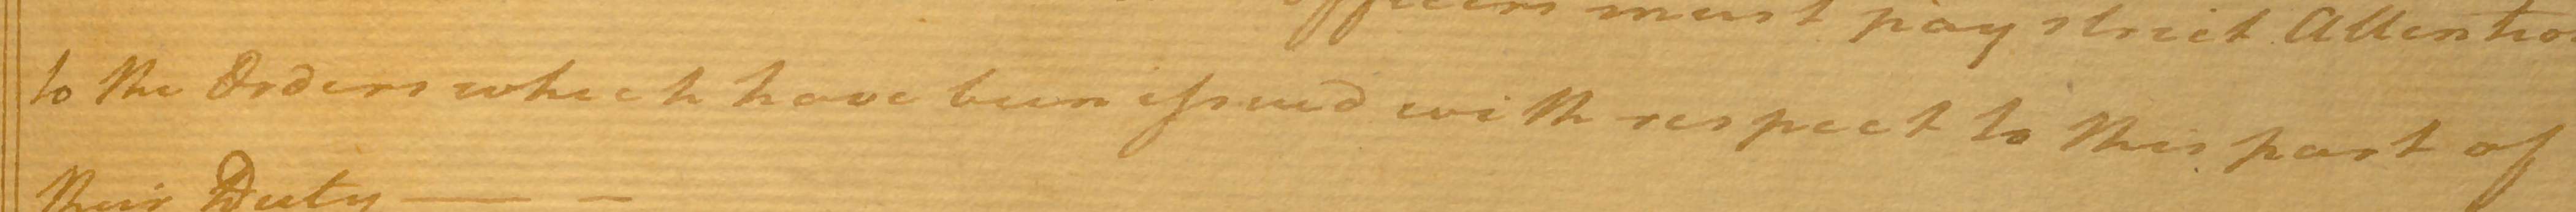to the Orders which have been issued with respect to this part of
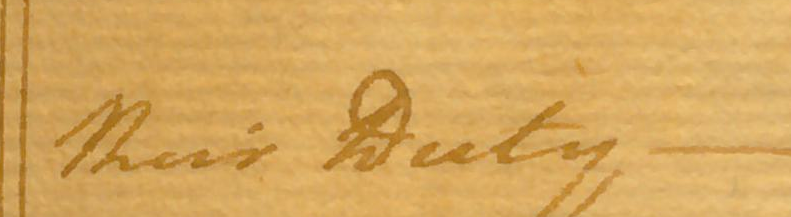their Duty-
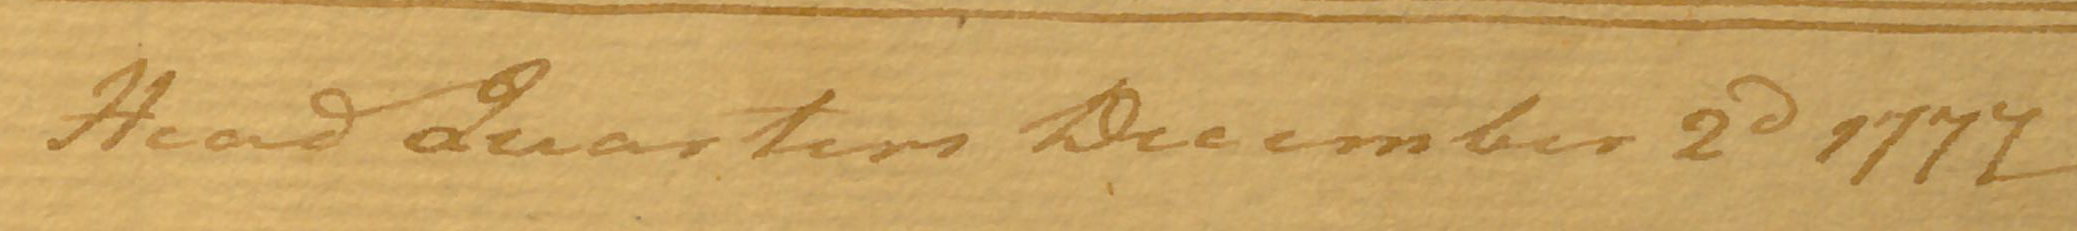Head Quarters December 2^d 1777
